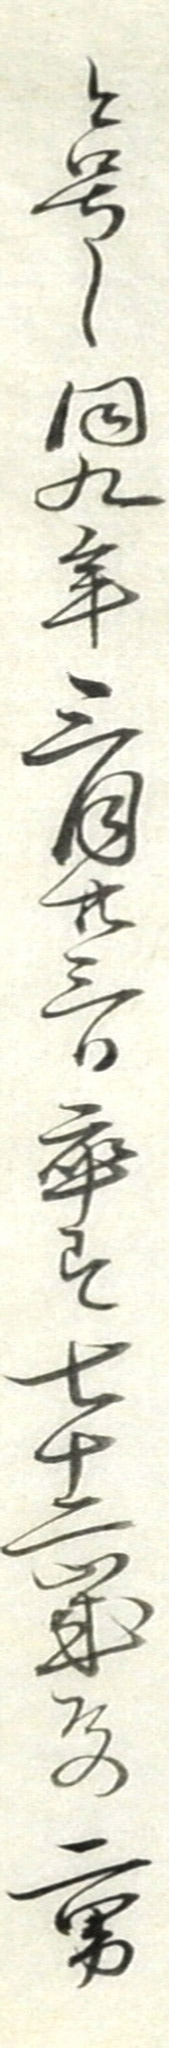と号し同九年三月廿三日卒す七十二歳その二男
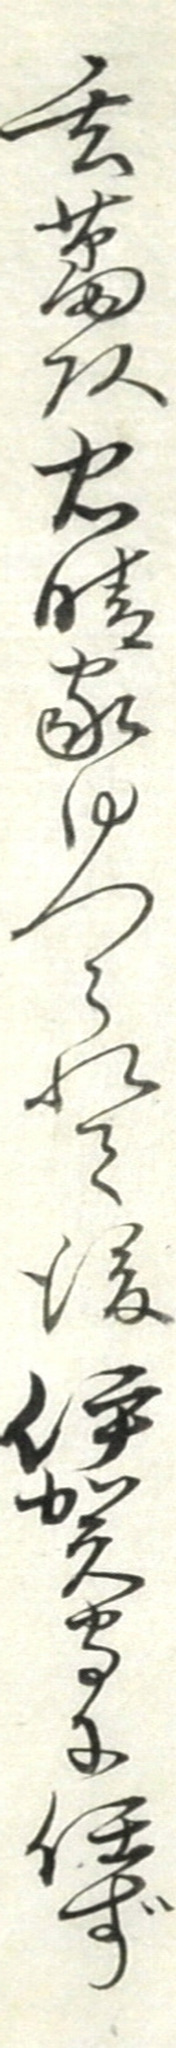玄蕃頭忠晴家ゆつられて後伊賀守に任ず
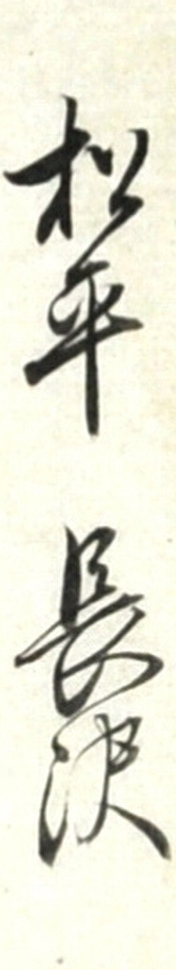松平長沢
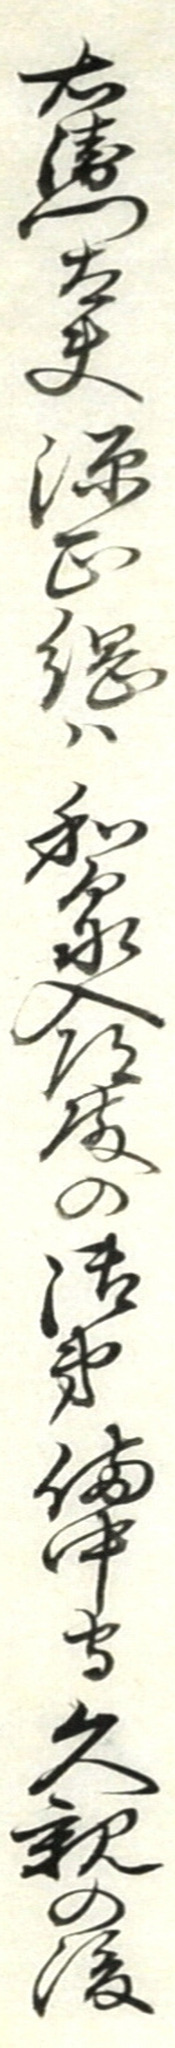右衛門太夫源正綱は和泉入道殿の御弟備中守久親の後
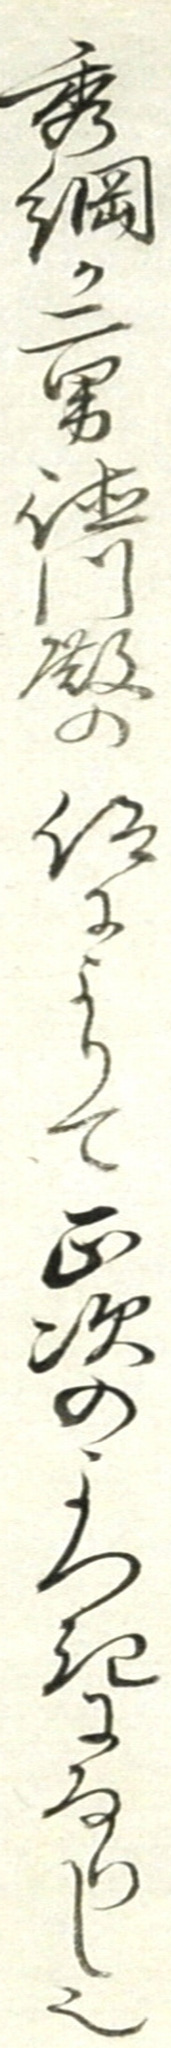秀綱か二男徳川殿の仰によりて正次のよつきになりし也
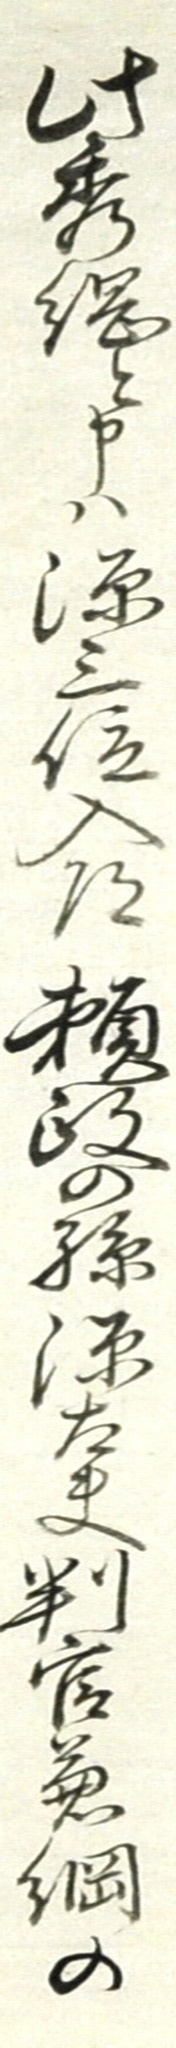此秀綱と申は源三位入道頼政の孫源太夫判官兼綱の
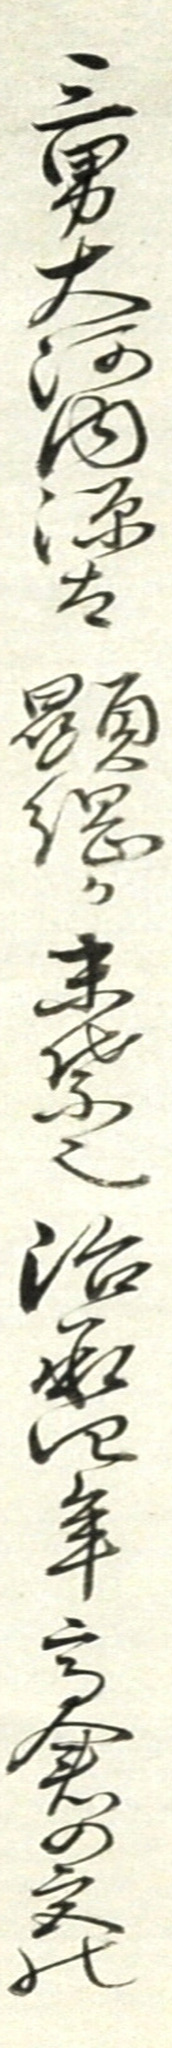三男大河内源太顕綱か末葉也治承四年高倉の宮の
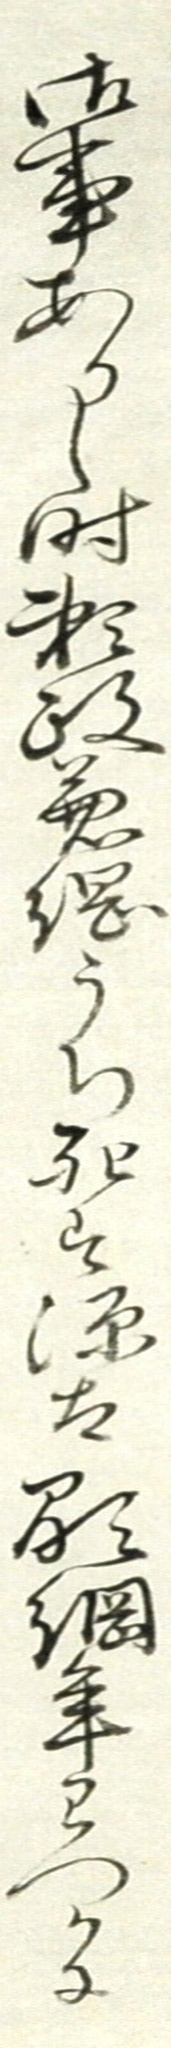御事ありし時頼政兼綱うち死す源太顕綱年わつかに
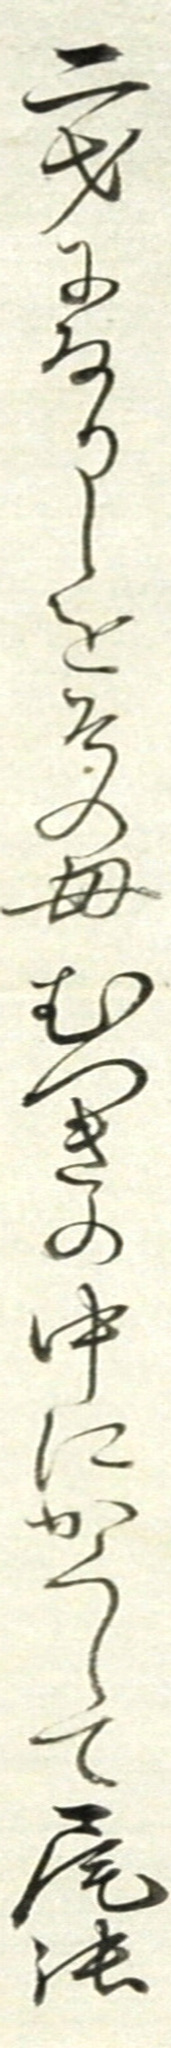二才になりしをその母むつきの中にかくして尾張
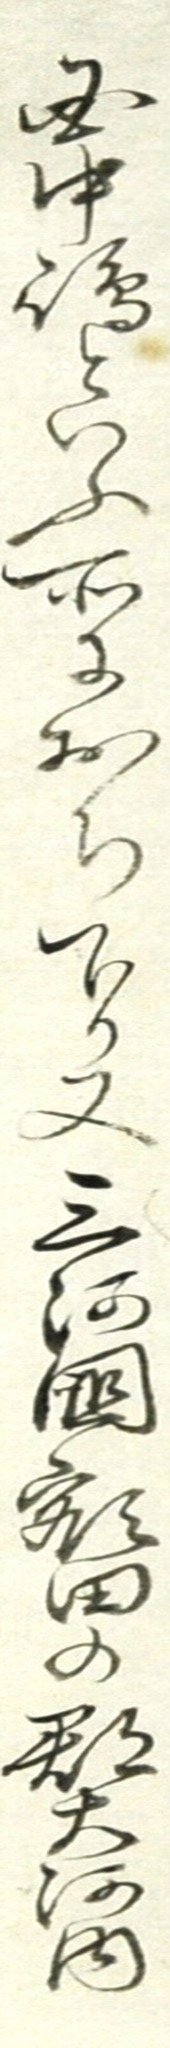国中島といふ所におち下り又三河国額田の郡大河内
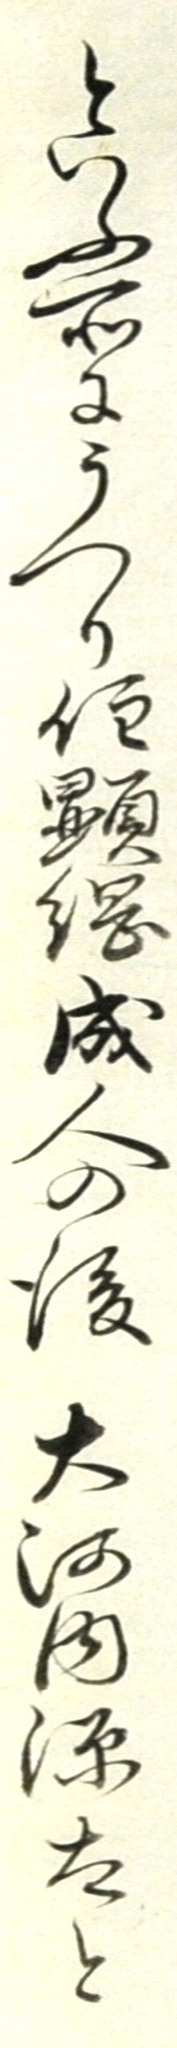といふ所にうつり住顕綱成人の後大河内源太と

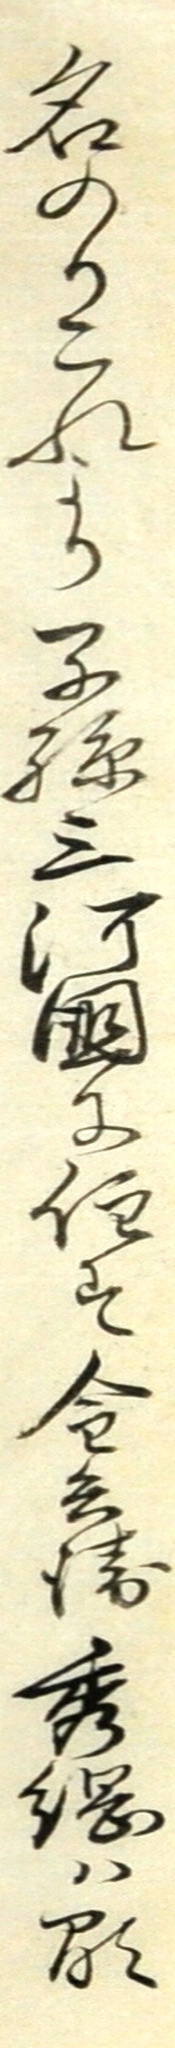名のりこれより子孫三河国に住す金兵衛秀綱は顕
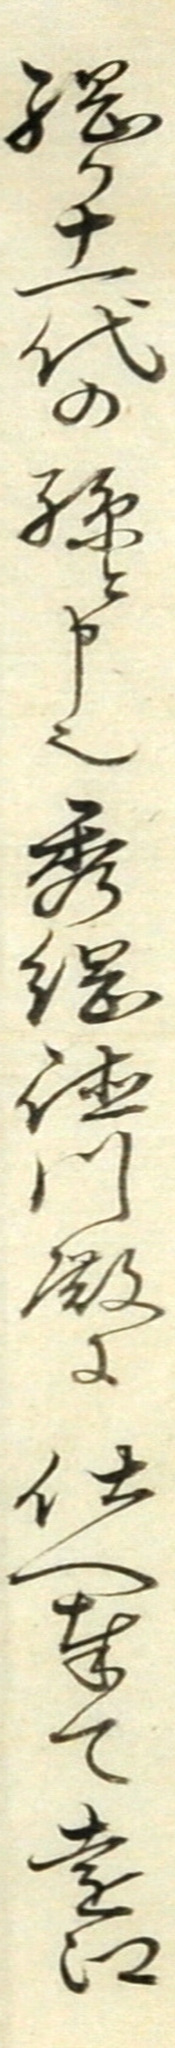綱か十一代の孫と申也秀綱徳川殿に仕へ奉て遠江
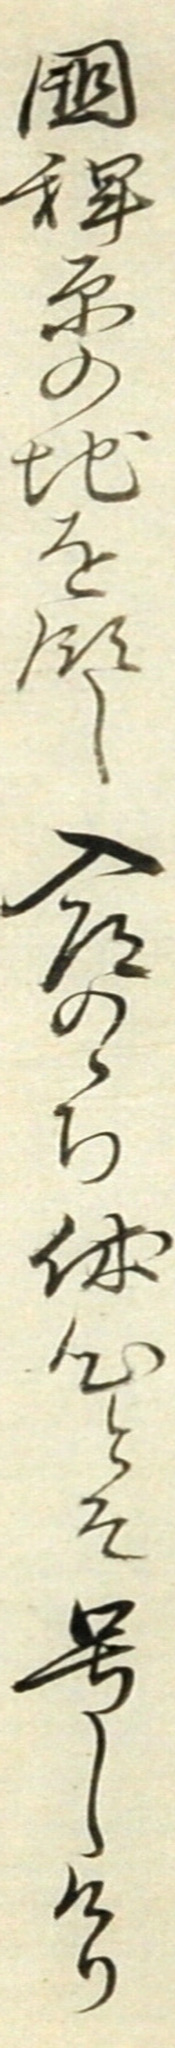国稗原の地を領し入道のゝち休心とそ号しけり
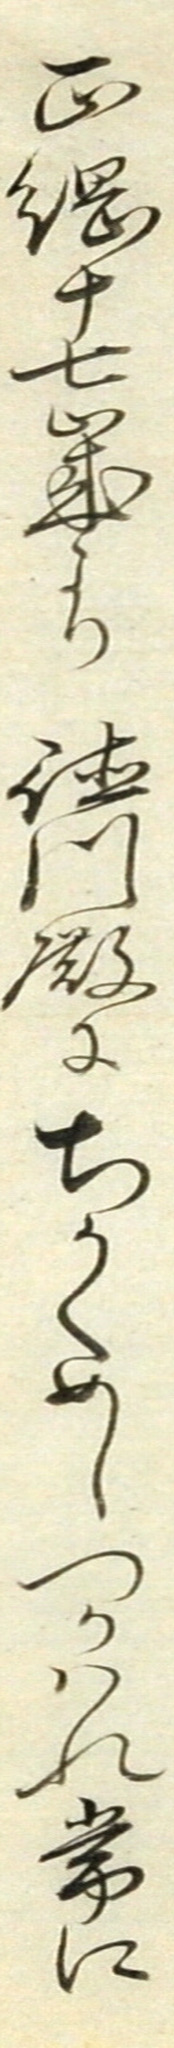正綱十七歳より徳川殿にちかくめしつかはれ常に
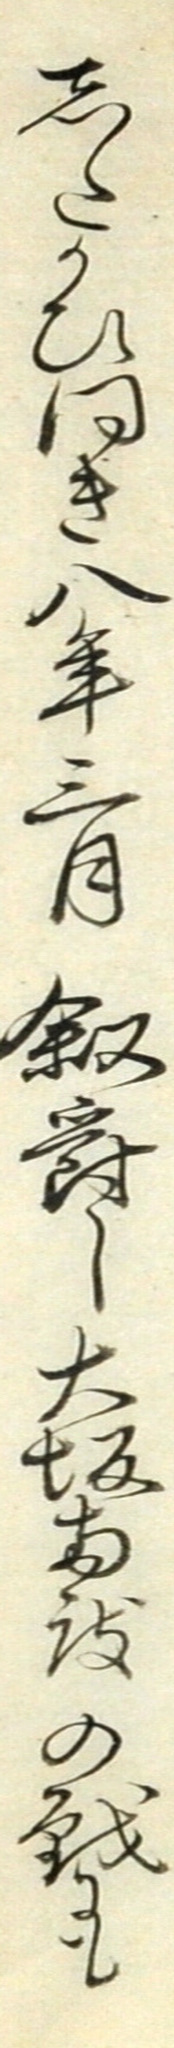したかひ同き八年三月叙爵し大坂両度の戦にも
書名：藩翰譜（二・三）
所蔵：伊那市立高遠町図書館・合同会社AMANE
